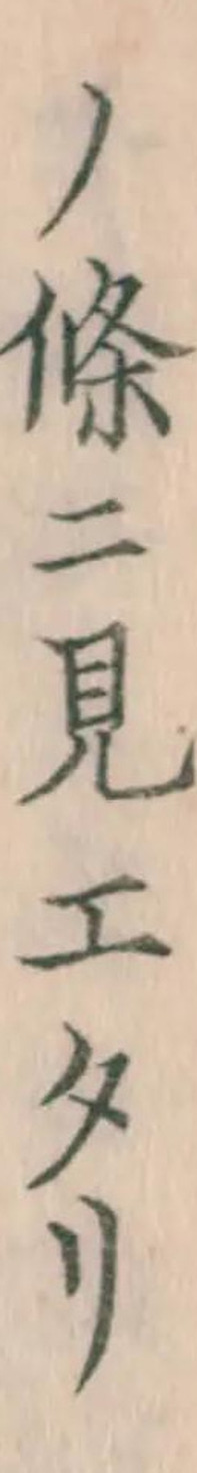ノ条ニ見エタリ

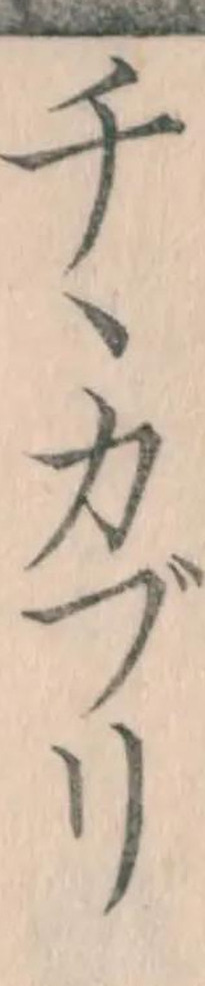チヽカブリ
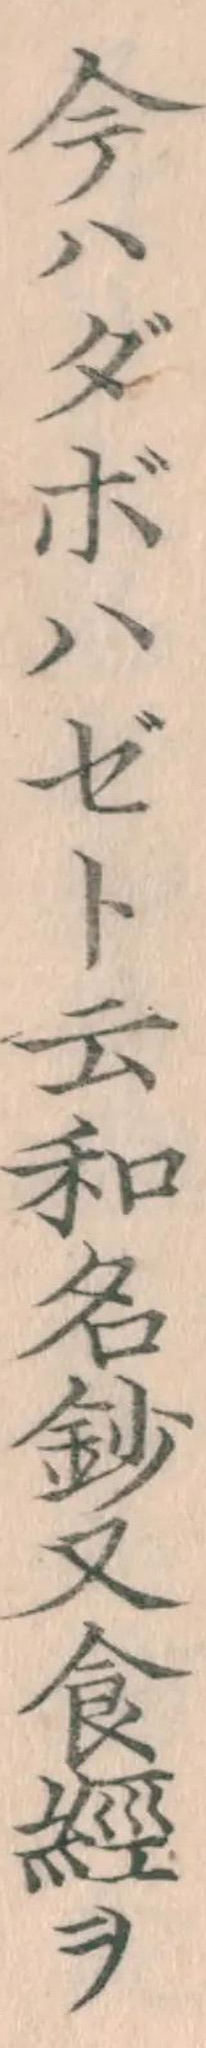今ハダボハゼト云和名鈔又食経ヲ
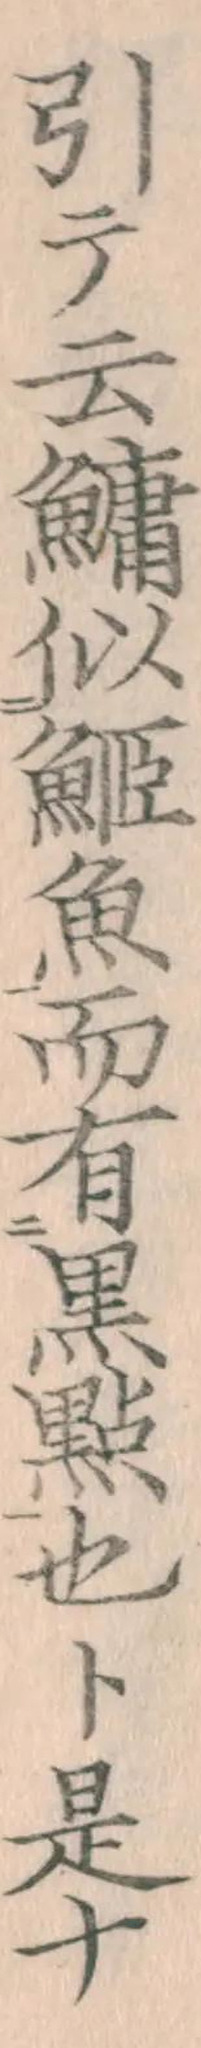引テ云鱅似魚而有黒点也ト是ナ
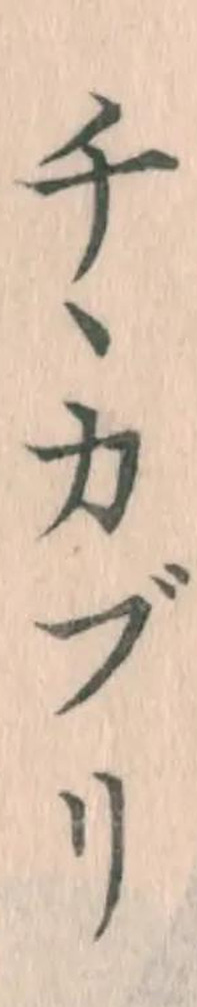チヽカブリ
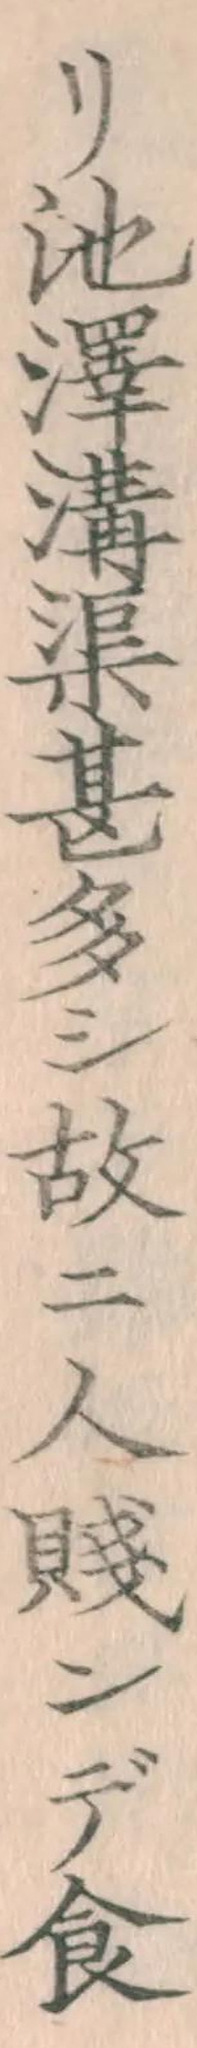リ池沢溝渠甚多シ故ニ人賤ンデ食
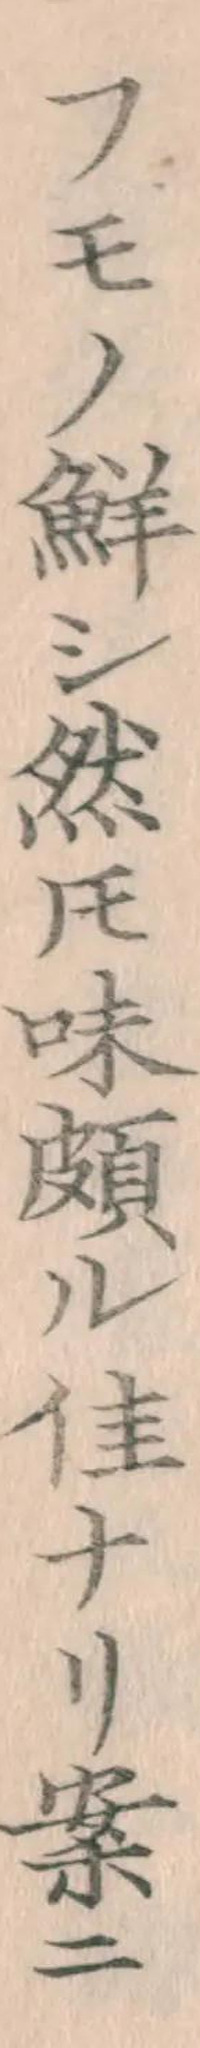フモノ鮮シ然トモ味頗ル佳ナリ案ニ
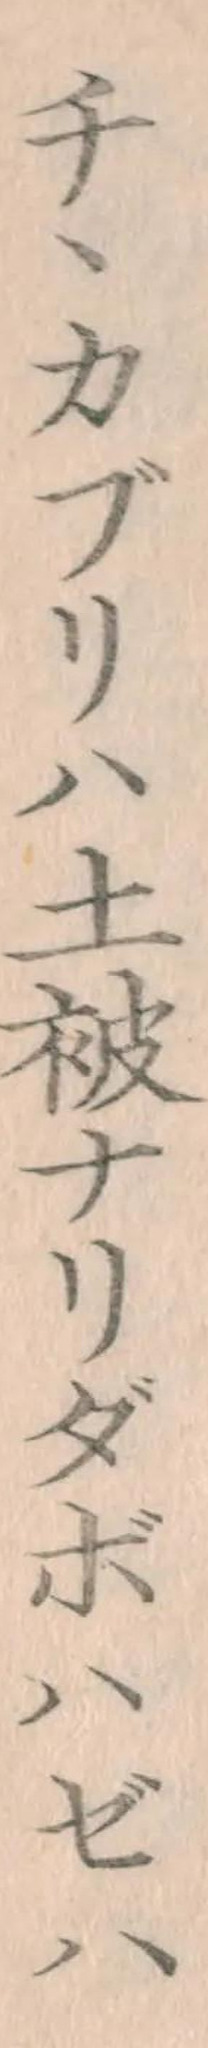チヽカブリハ土被ナリダボハゼハ
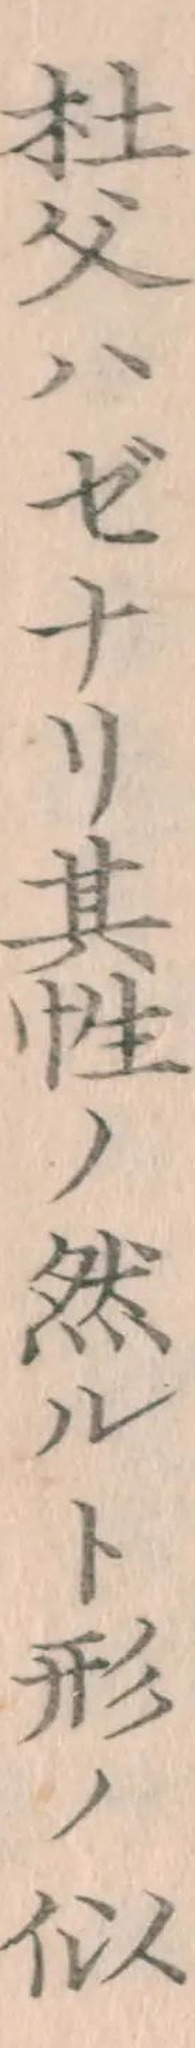杜父ハゼナリ其性ノ然ルト形ノ似
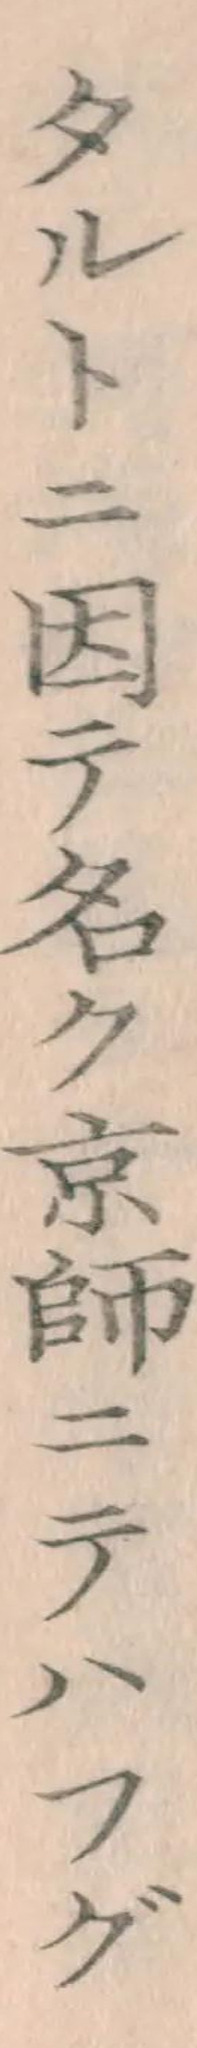タルトニ因テ名ク京師ニテハフグ
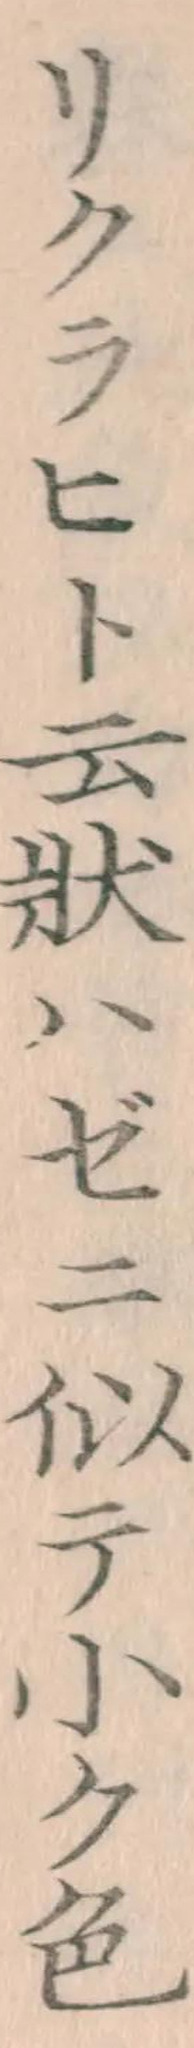リクラヒト云状ハゼニ似テ小ク色
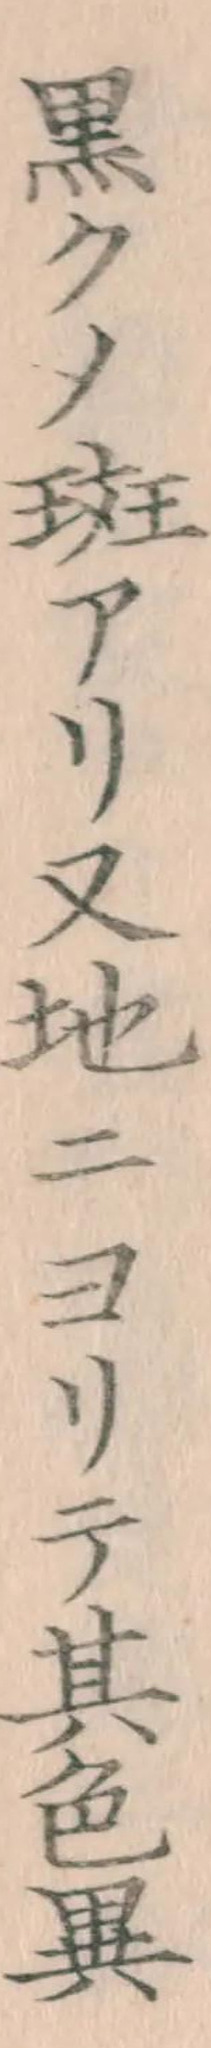黒クシテ斑アリ又地ニヨリテ其色異
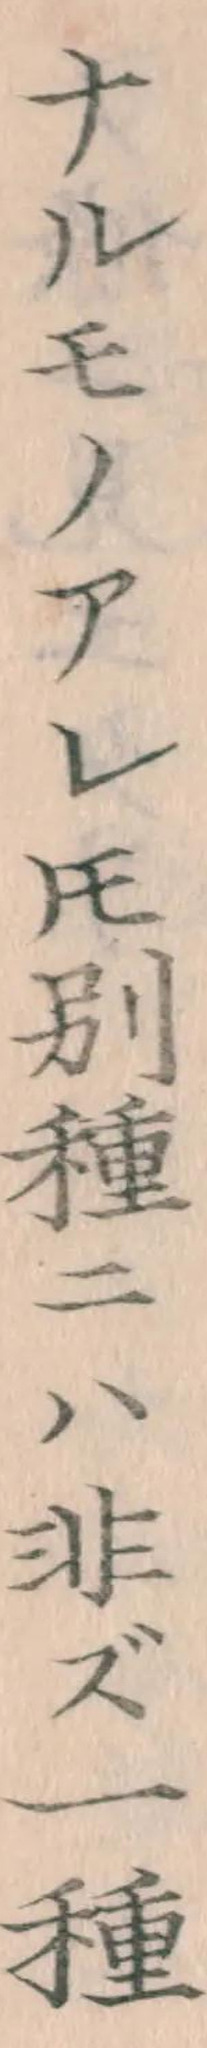ナルモノアレトモ別種ニハ非ズ一種
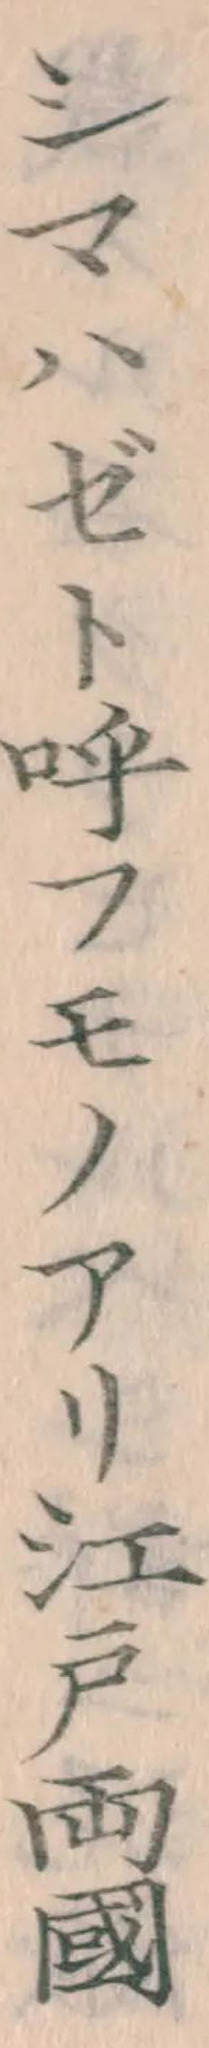シマハゼト呼フモノアリ江戸両国
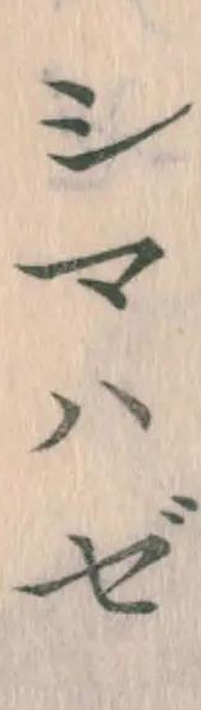シマハゼ
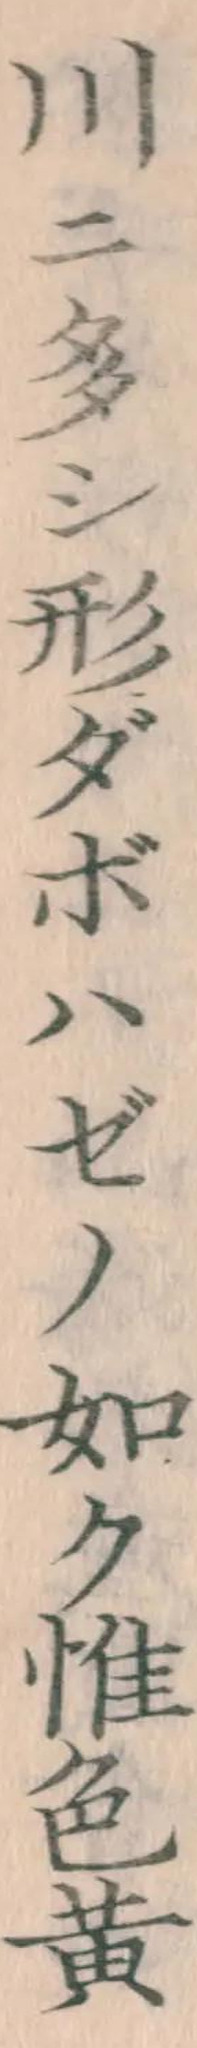川ニ多シ形ダボハゼノ如ク惟色黄
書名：皇和魚譜 2巻
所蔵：国立国会図書館 National Diet Library, JAPAN
